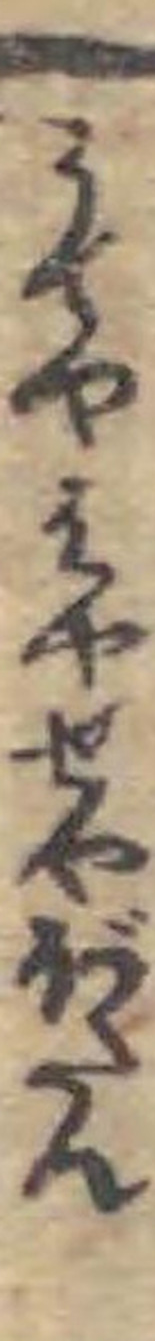うてやはやせやぼたん
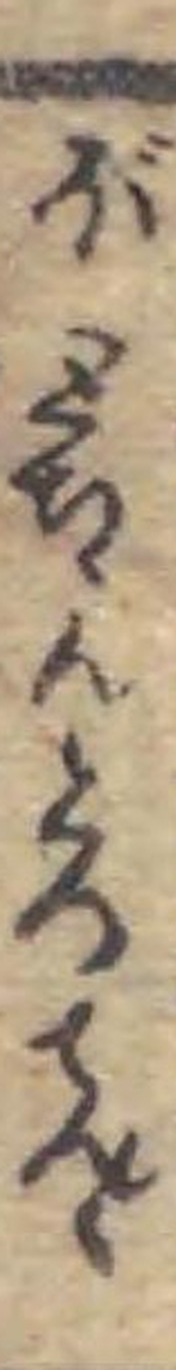ぼとちゝんとつてん〳〵
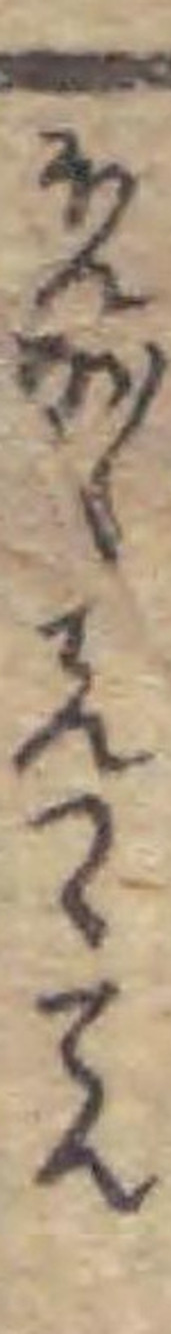ほんほ〳〵てんつくてん
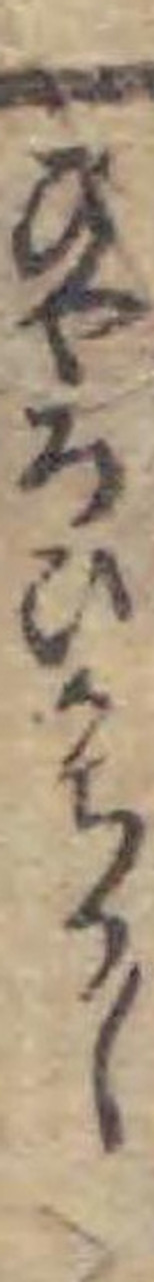ひやろひかちか〳〵
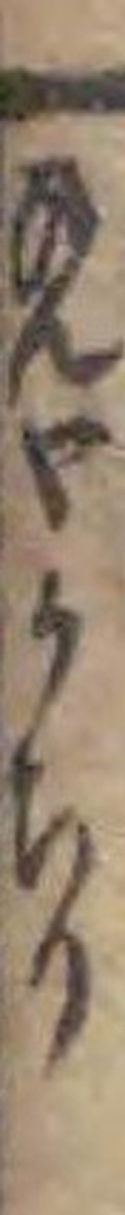ひんやかちり
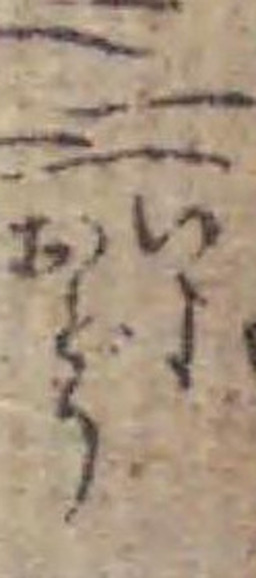おどり
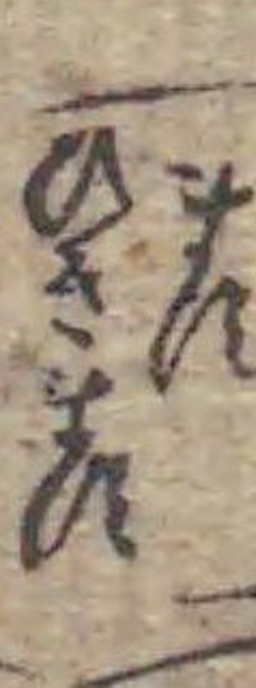ひきます
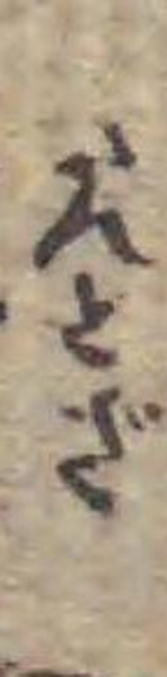たんとざ

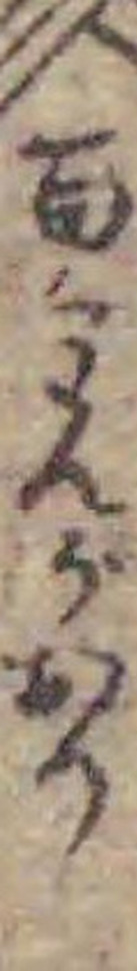百くわんがおり
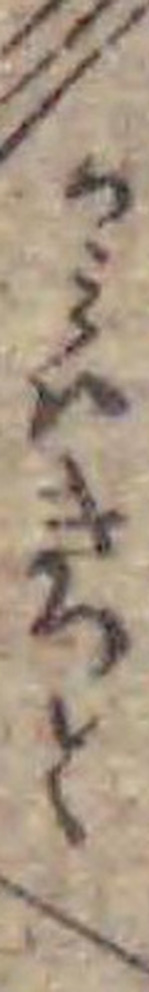かみはきつと
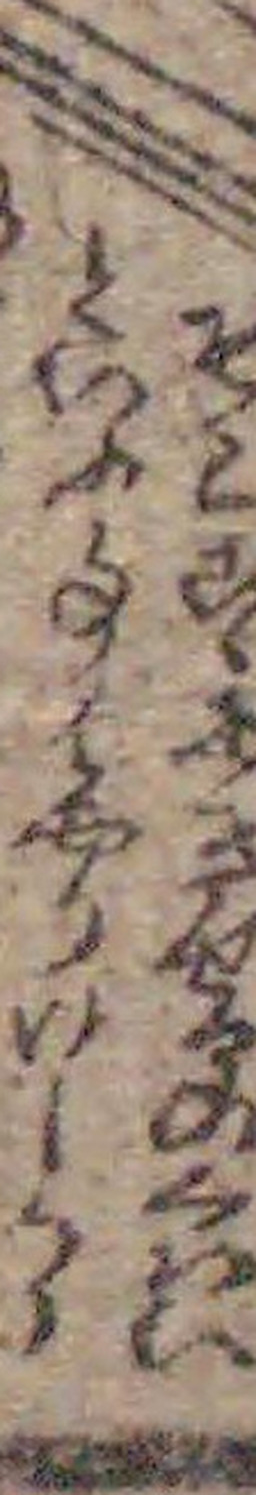といふ事はやりけしから
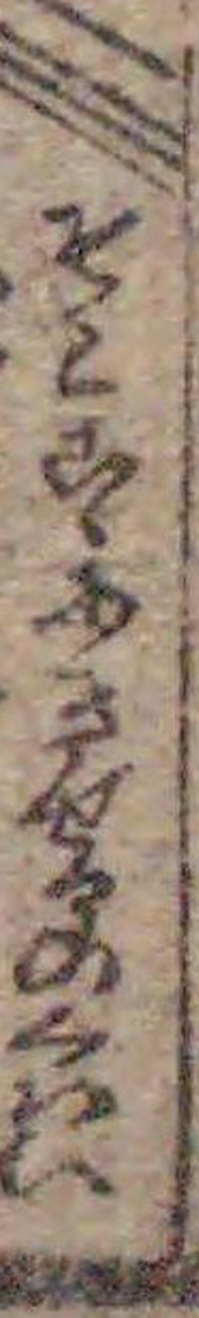そここゝにきせるのくはい
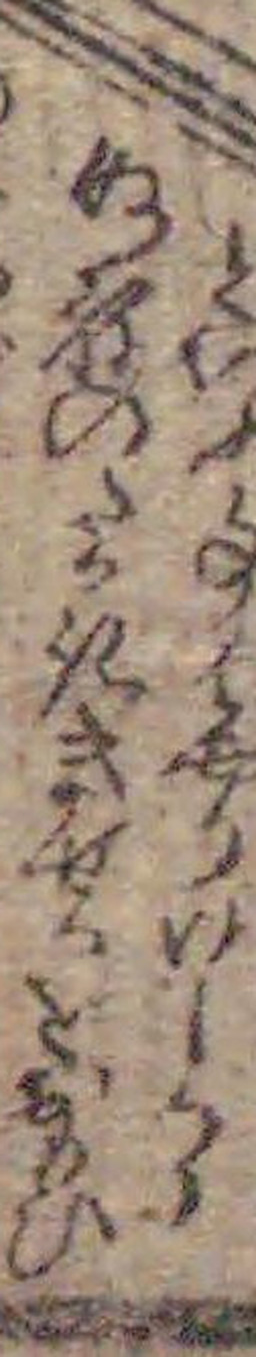ぬねのたかききせるをおもひ
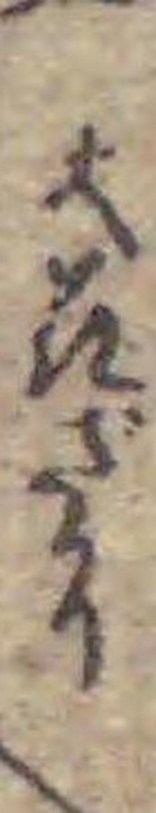大花ざかり
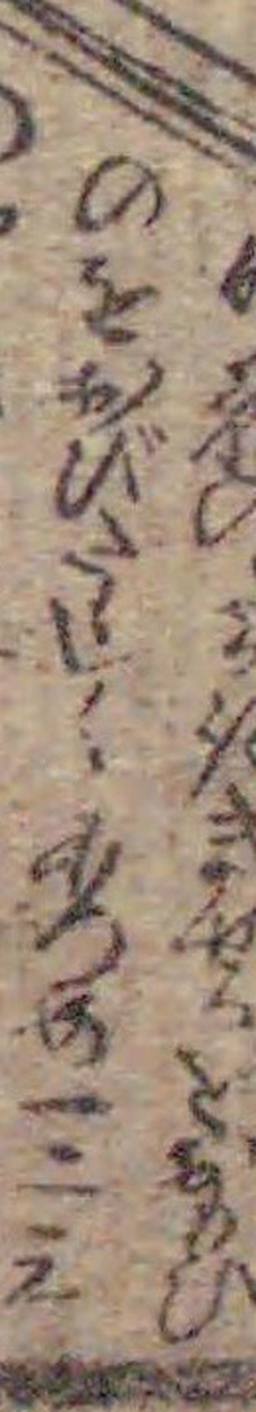のをおびたゝしくあつめ一二三
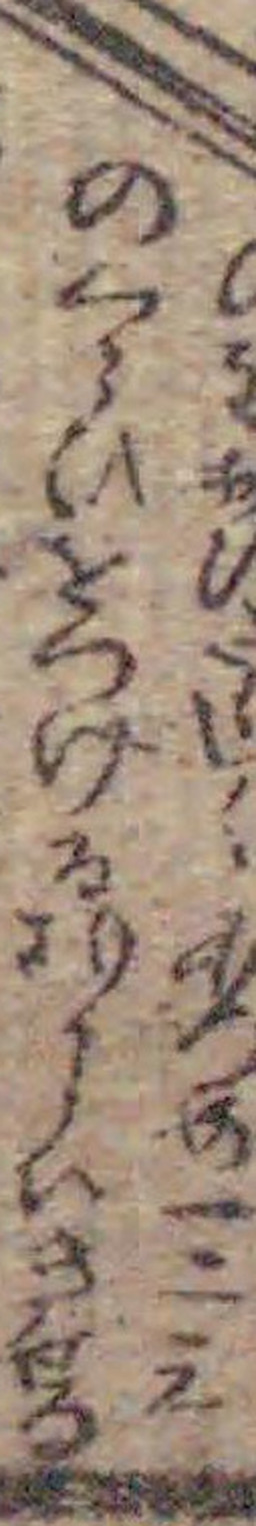のくらひをつけるむかしはきせる
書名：威気千代牟物語 : 2巻
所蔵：国立国会図書館 National Diet Library, JAPAN
